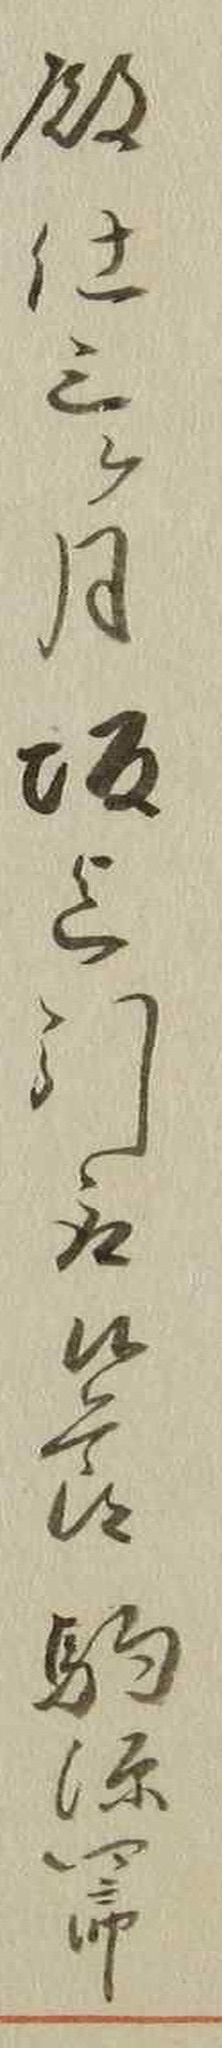殿仕三ヶ月坂迄引取候節駒源四郎
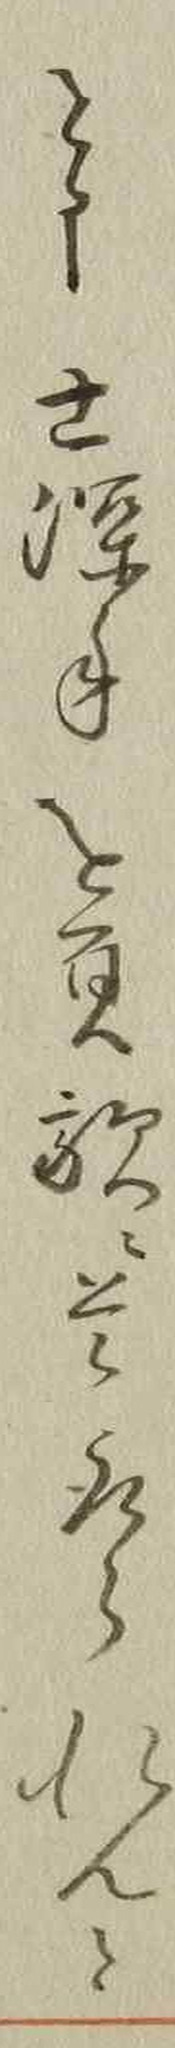と申士深手を負敵ニに首取られんと
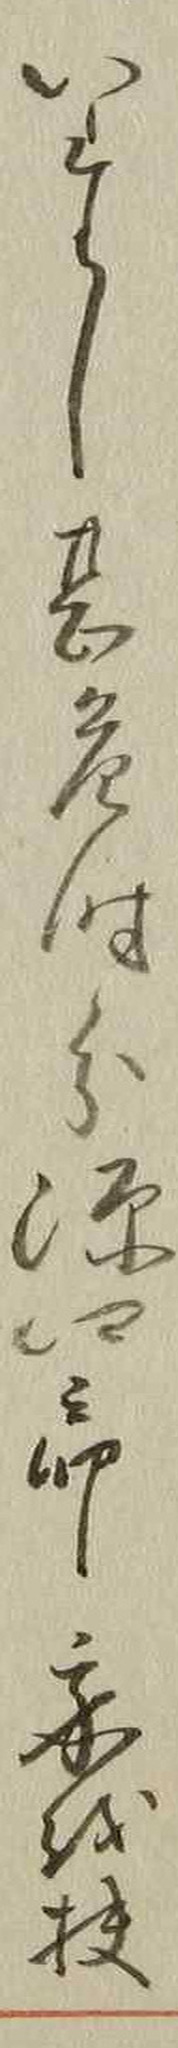いたし甚危時分源四郎卒を扶
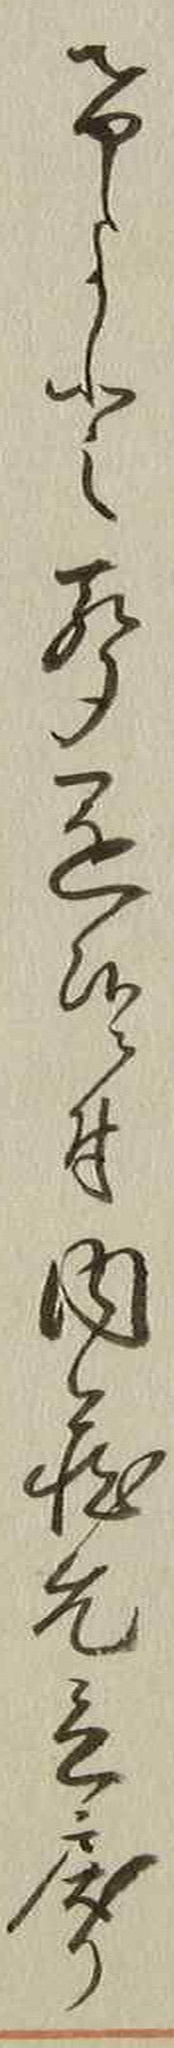けよと声懸候ニ付内蔵允立戻り
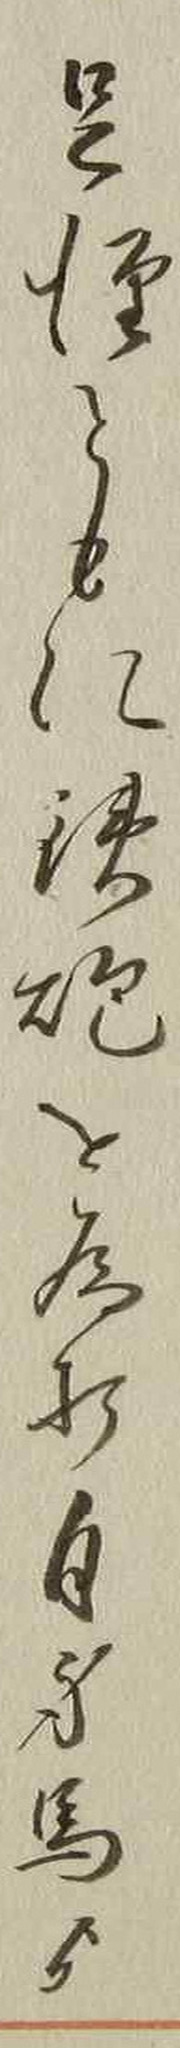足軽ともに鉄炮を為打自身馬ゟ
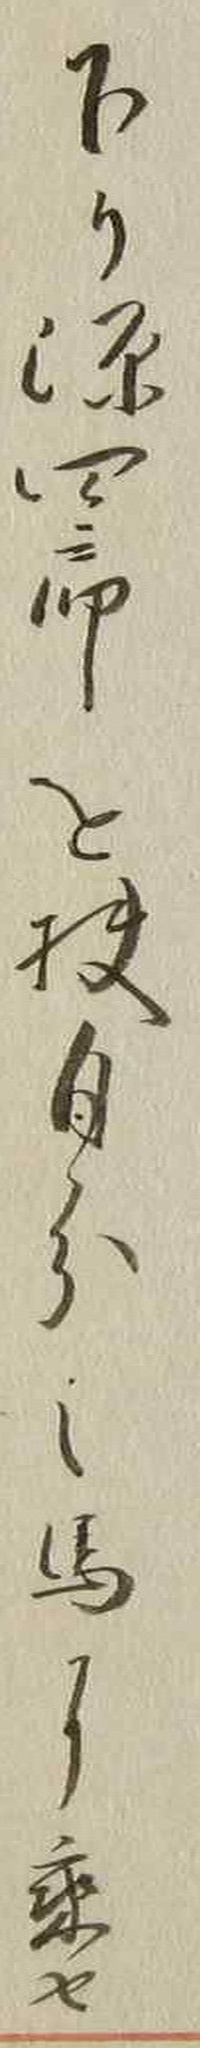下り源四郎を扶自分之馬に乗セ
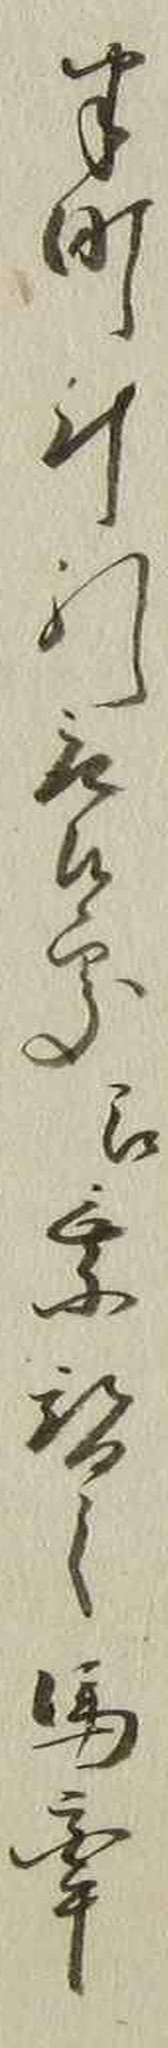半町計引取候処江乗替之馬牽
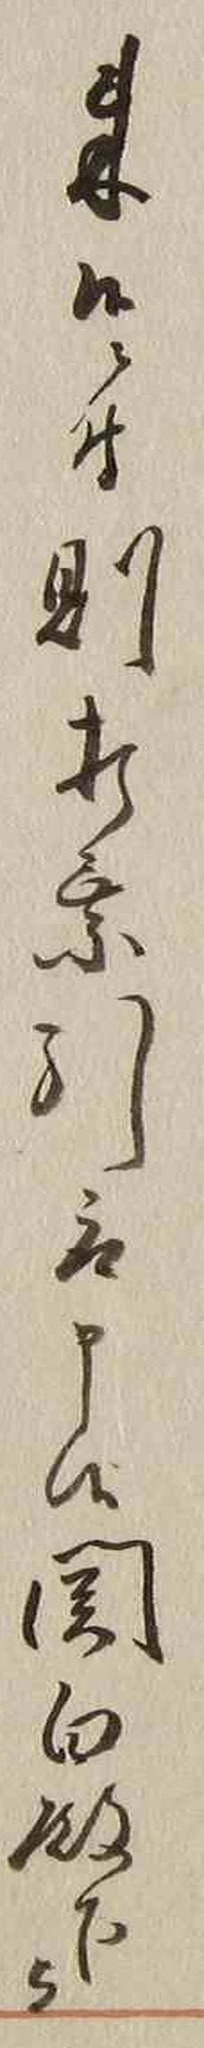来候ニ付則打乗引取申候関白殿下与
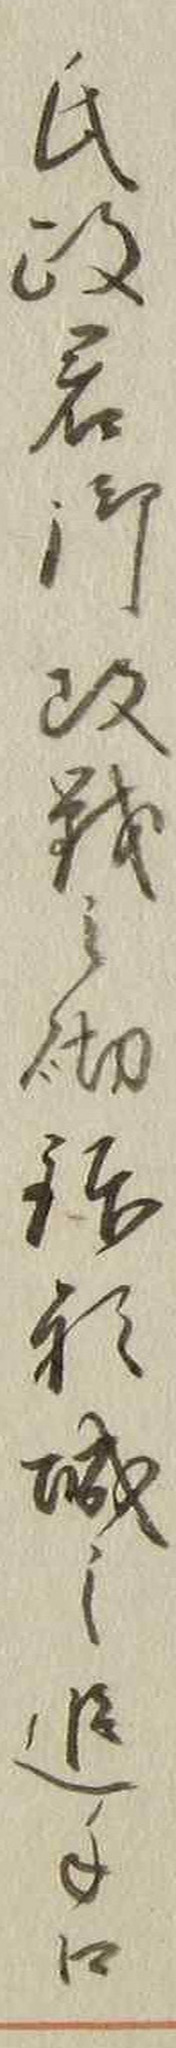氏政君御攻戦之砌針形城之追手口
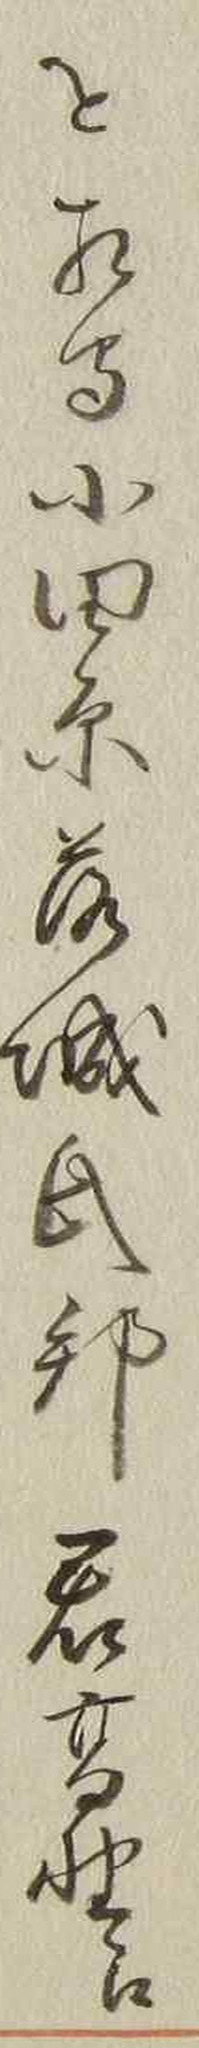を相守小田原落城氏邦君高野江
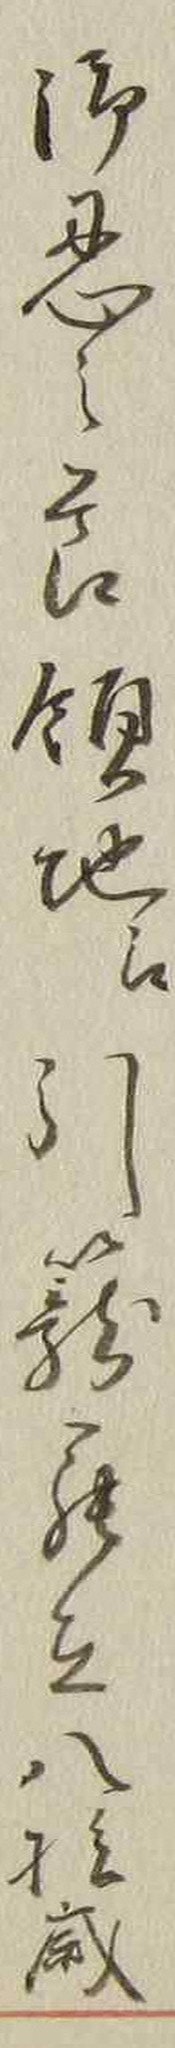御忍之節領地江引籠罷在八拾歳
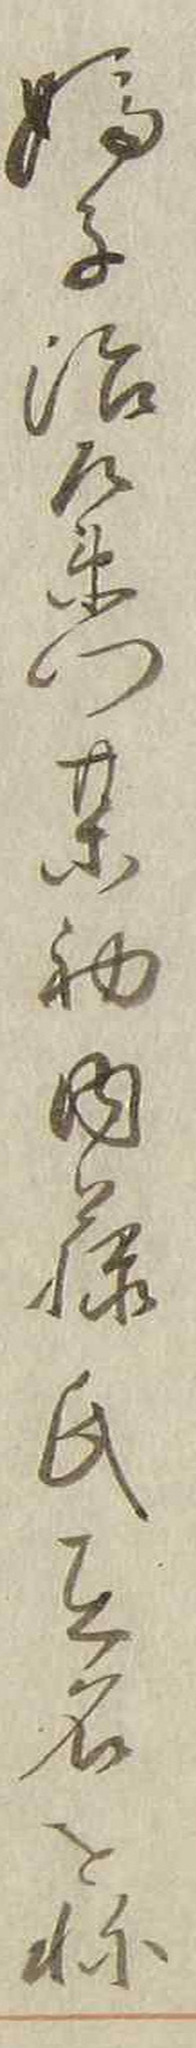嫡子治左衛門某初内藤氏在名を称

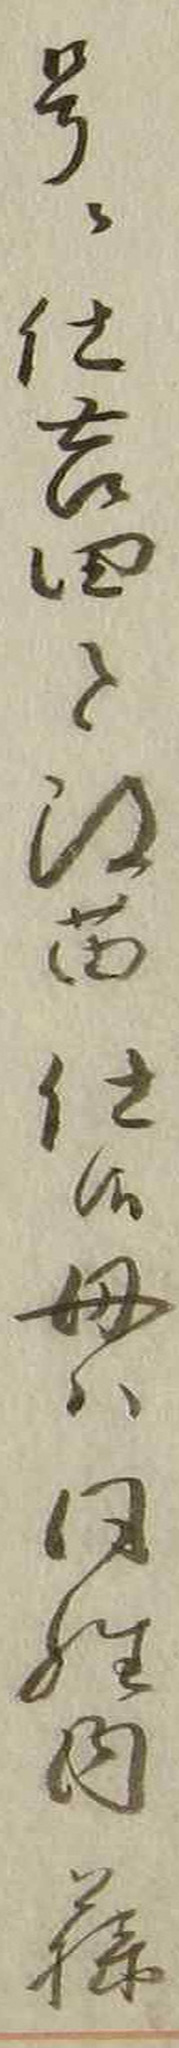号ニ仕吉田と改苗仕候母ハ同姓内藤
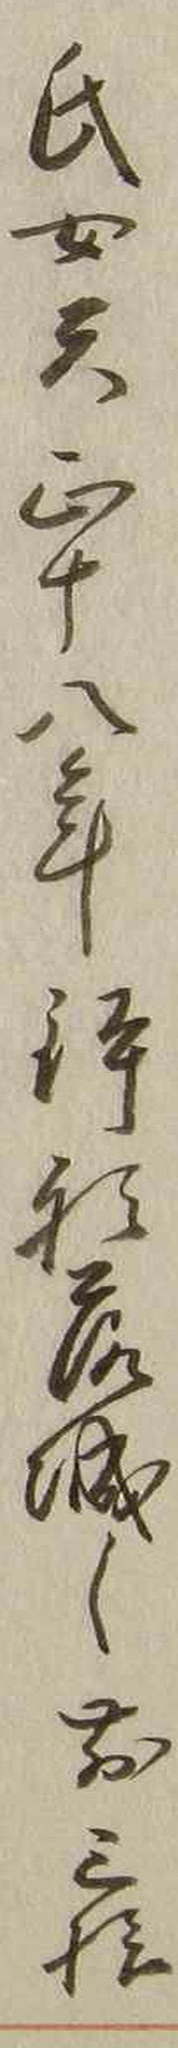氏女天正十八年鉢形落城之前三拾
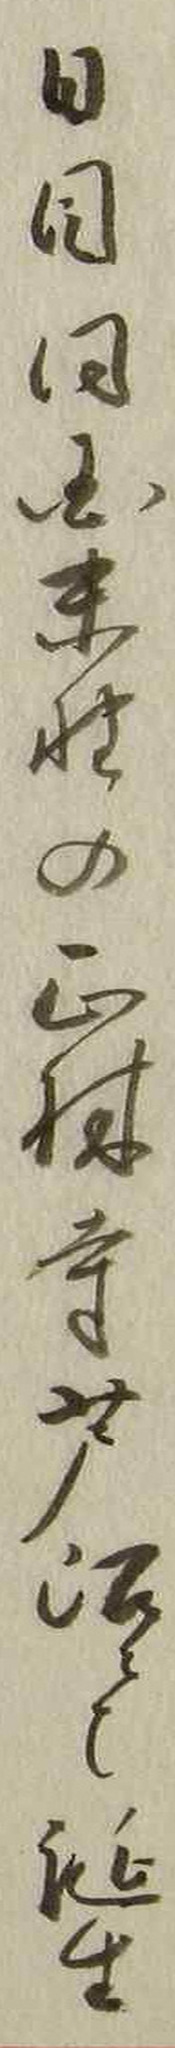日目同国末野の正林寺芦沼ニて誕生
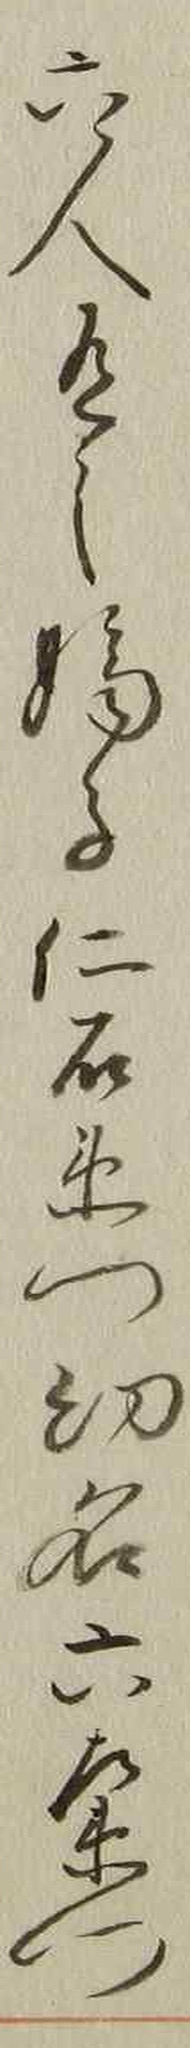六人有之嫡子仁右衛門幼名六左衛門
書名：諸士系譜　巻之122　よ之部5
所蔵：会津若松市立会津図書館
